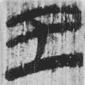王
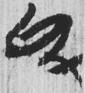○（仰）
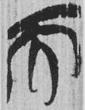天
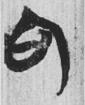吟
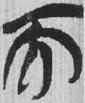而
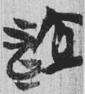泣
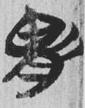{胃刀}（謂）
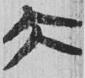大（太）
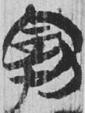○（宰）
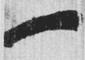一
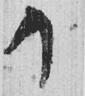人
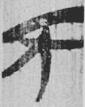不
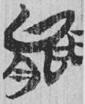能
